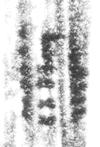君
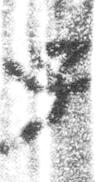子
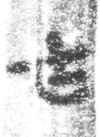古
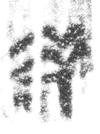昔
